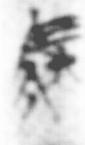駟
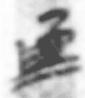爲
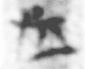○（左）
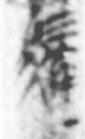○（服）
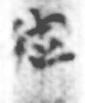迅
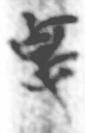弁
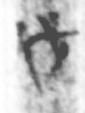伐
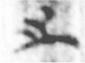之
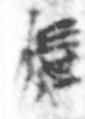騏
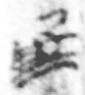○（右）
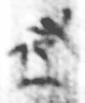○（服）
